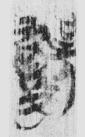{喪死}（喪）
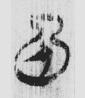○（温）
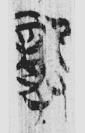龚（恭）
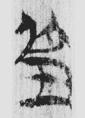○（淑）
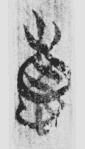惠
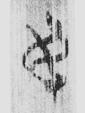民
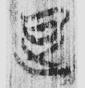是
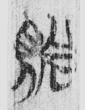○（瞻）
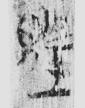○（望）
